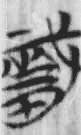戠
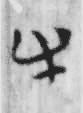牛
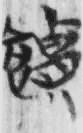饋
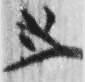之
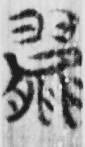○（一）
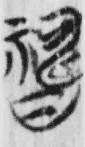禱
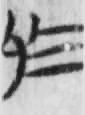於
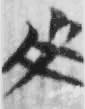文
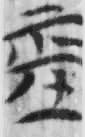坪（平）
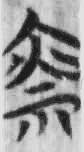○（夜）
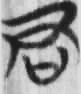君
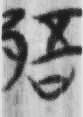郚
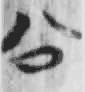公
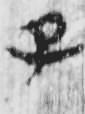子
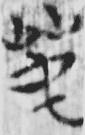○（春）
